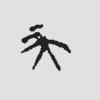天
